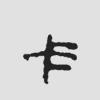上下
